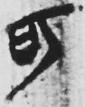可
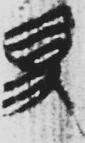○（得）
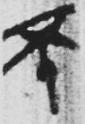不
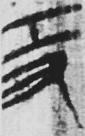攻
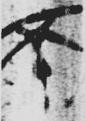不
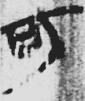可
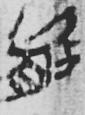能
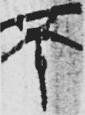不
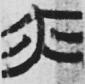亦
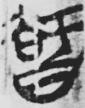智（知）
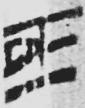亙（恆）
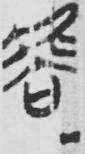唬（乎）
